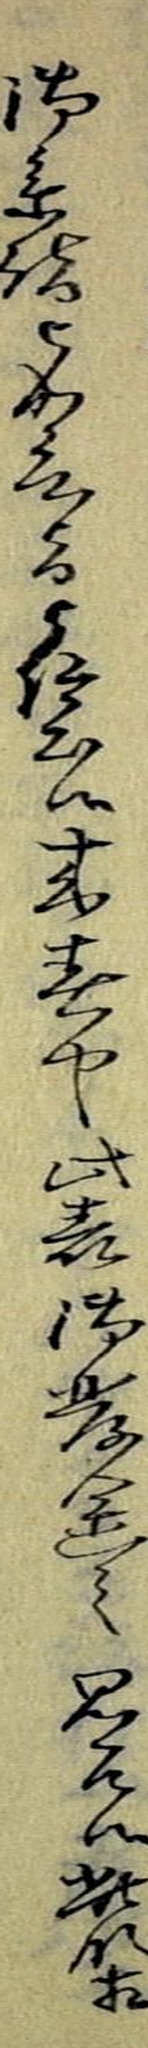御参詣被成度旨被仰出候来春中此表御発途之思召候此段相
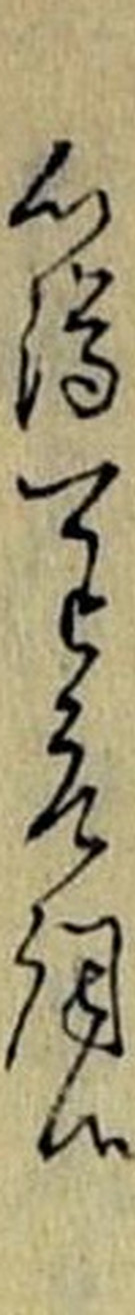心得可被取調候
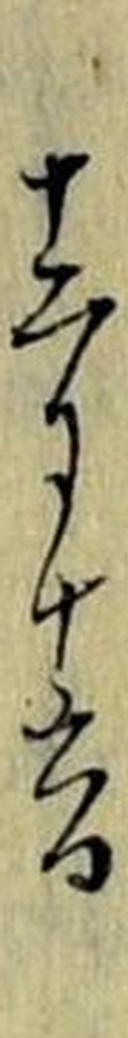十二月十六日

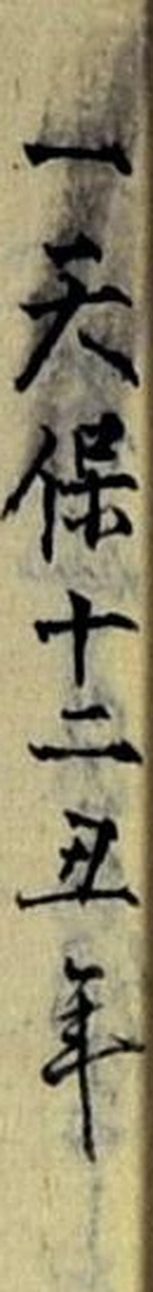一天保十二丑年
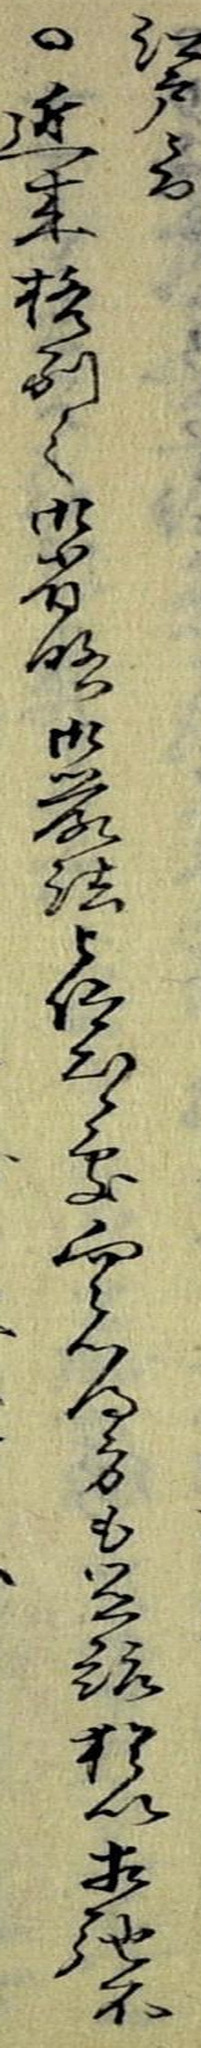○近来各別之御省略御厳重法被仰出候処向々心得方も宜趣猶以相弛不
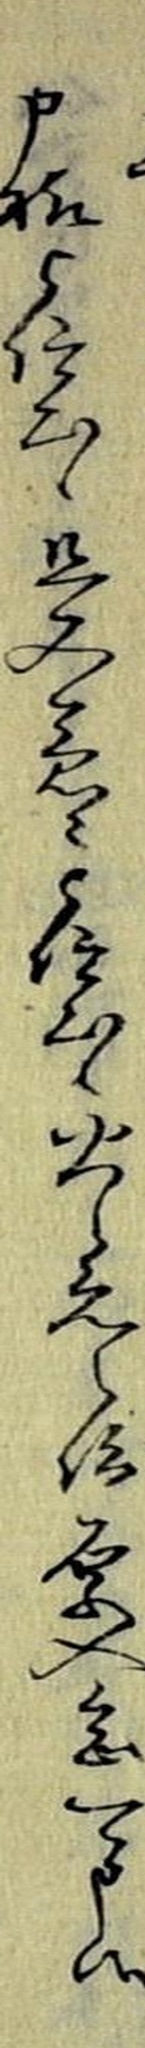申様被仰出候且又兼々被仰出候火之元之儀厚入念可申事
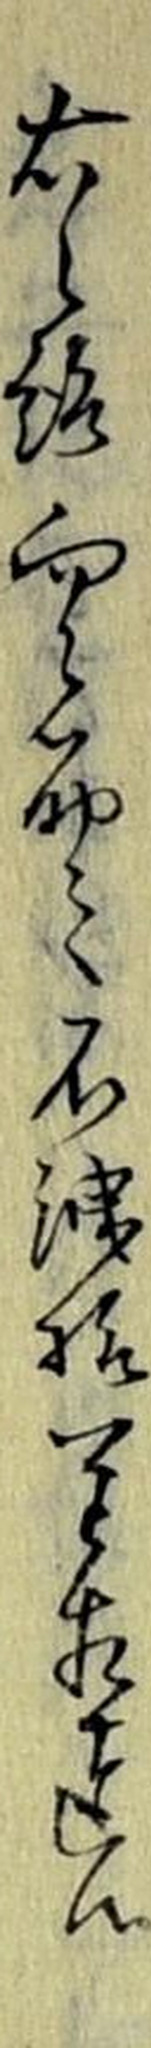右之趣向々筋々へ不洩様可被相達候
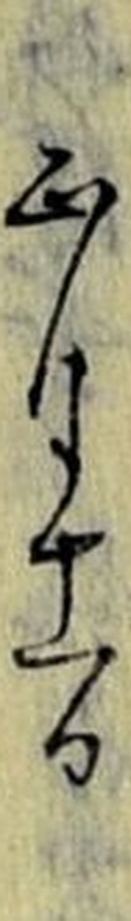正月十一日
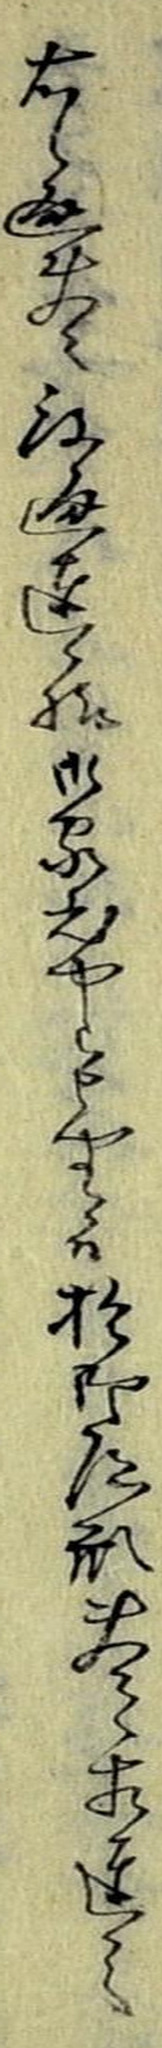右之通夫々致通達候様御家老中被申聞候に付於御屋形夫々へ相達之
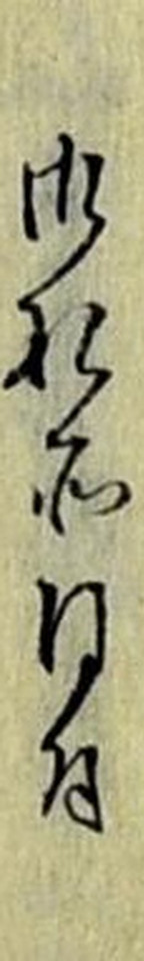御札所目付
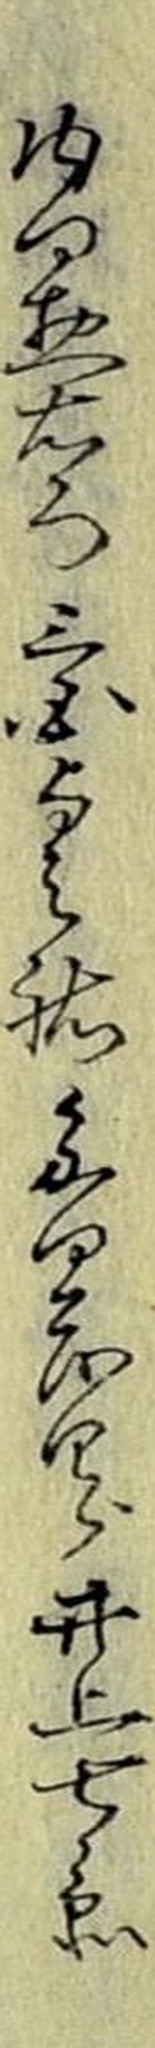内田惣左衛門三国与之祐多田茂四郎井上七兵衛
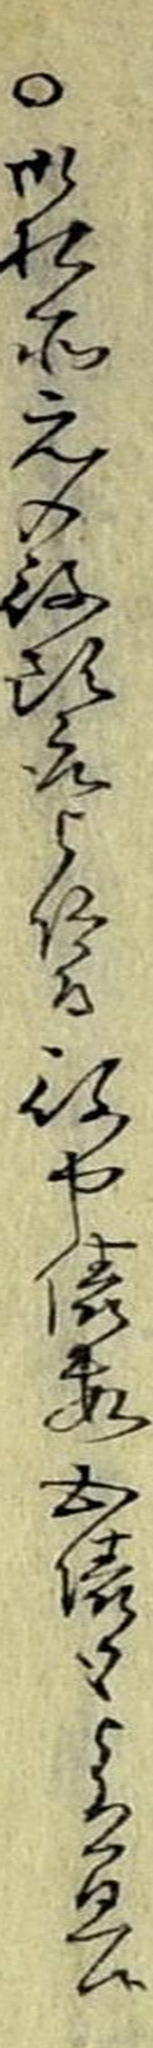○御札所元〆役頭取被仰付役中俵数五俵つヽ被下置候
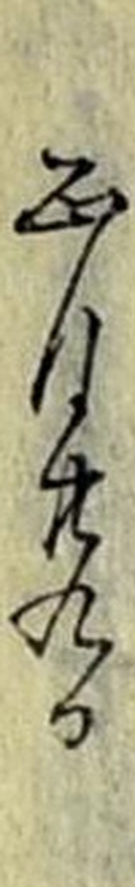正月廿九日
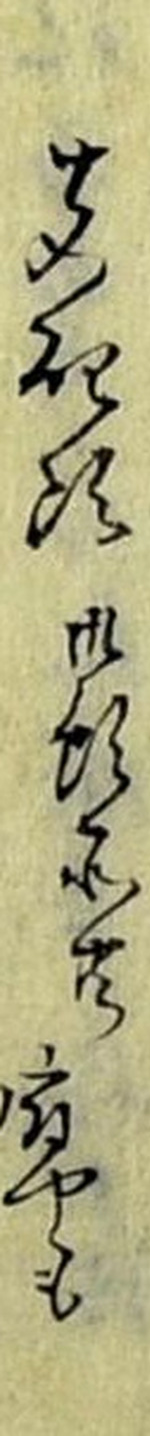支配頭御預所共府中へも

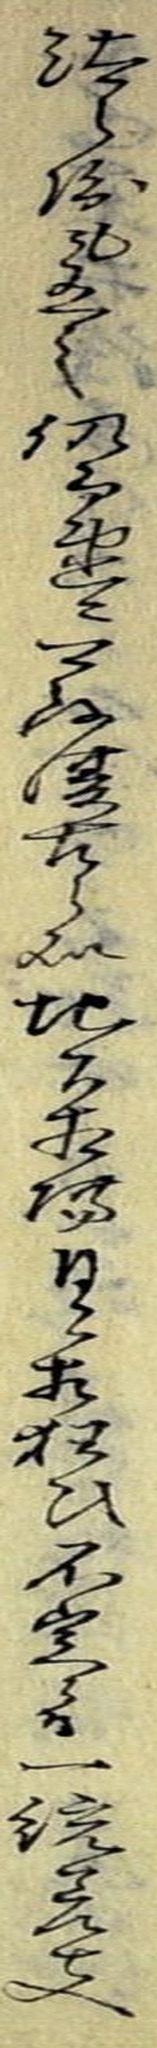汰之儀も有之仍而速に可致復古候処地下相場日々相狂ひ不定に付一統差支
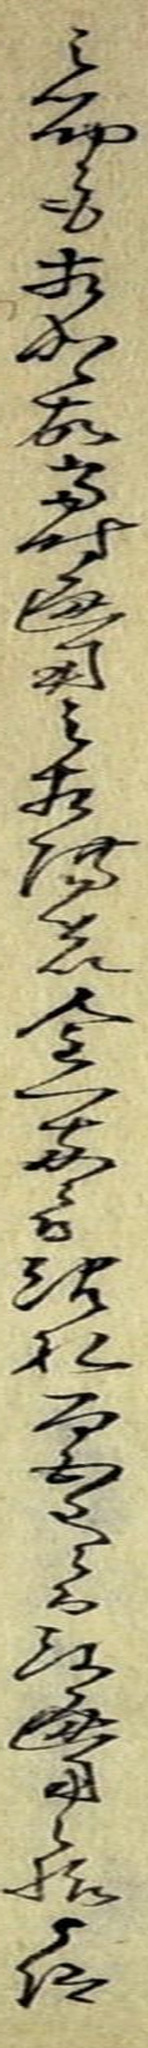之筋にも相成候故当時通用之相場を以金一両に付銀札百五匁に而致通用候様被仰
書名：命令之部 六
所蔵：福井県文書館 Fukui Prefectural Archives
